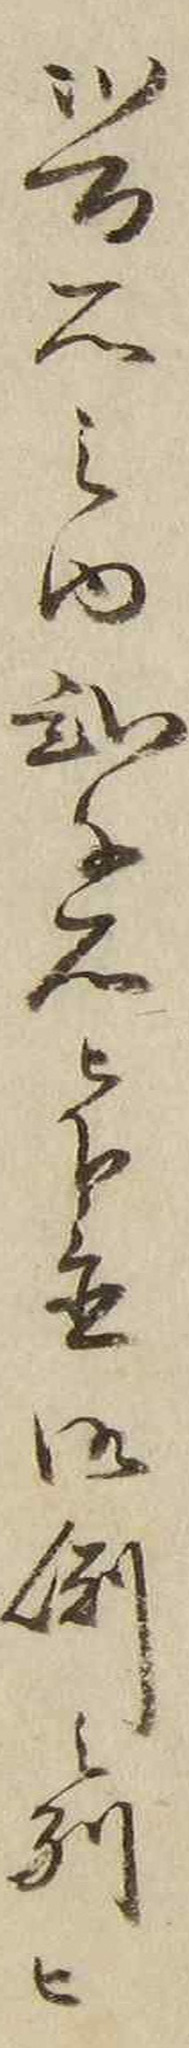弐百石之内弐千石被下置御側之列被

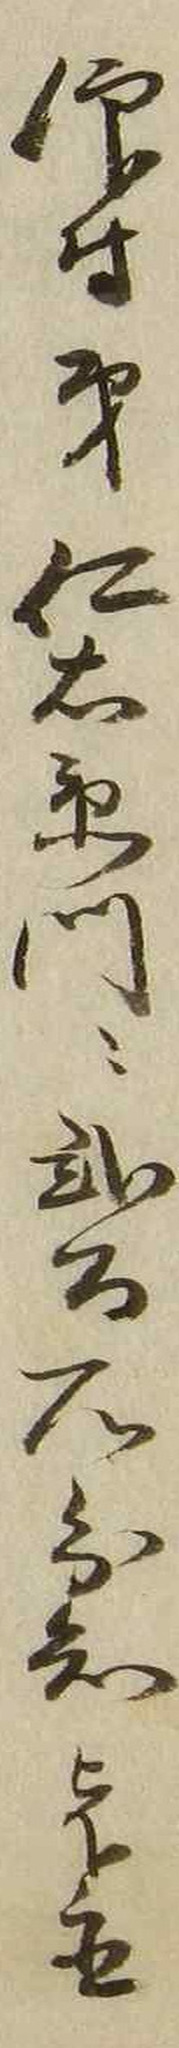仰付弟仁右衛門に弐百石分知被下置
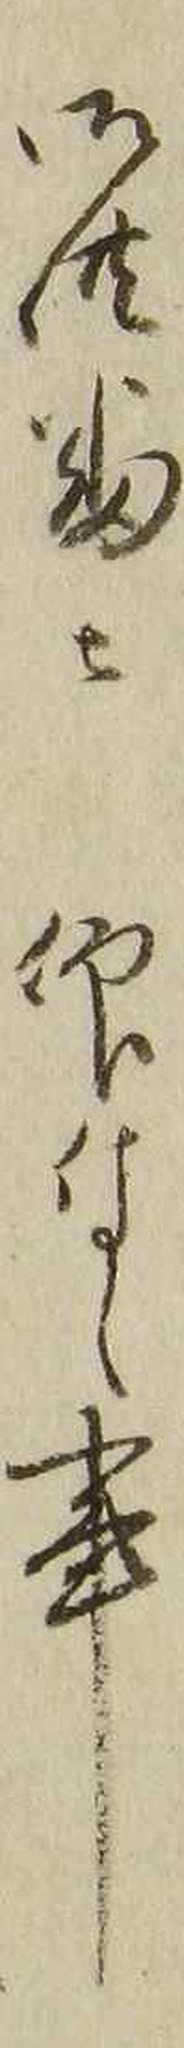御供番被仰付候事
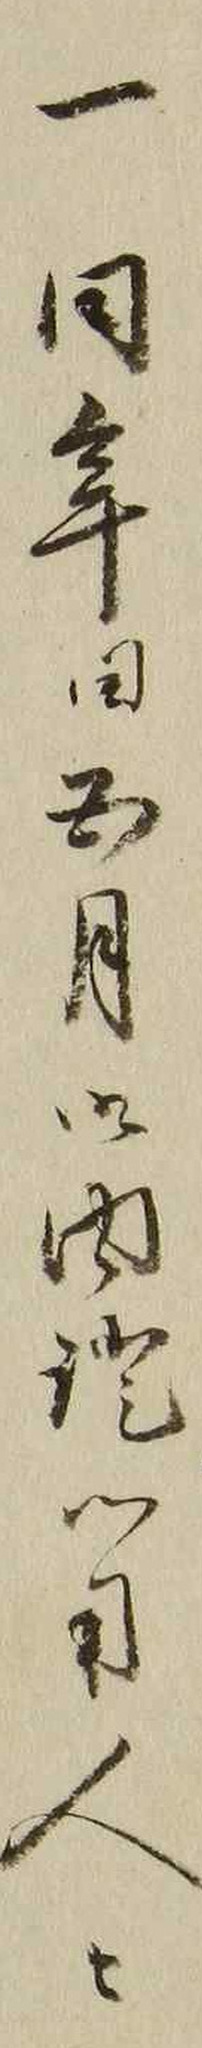一同年閏五月御内證御用人被
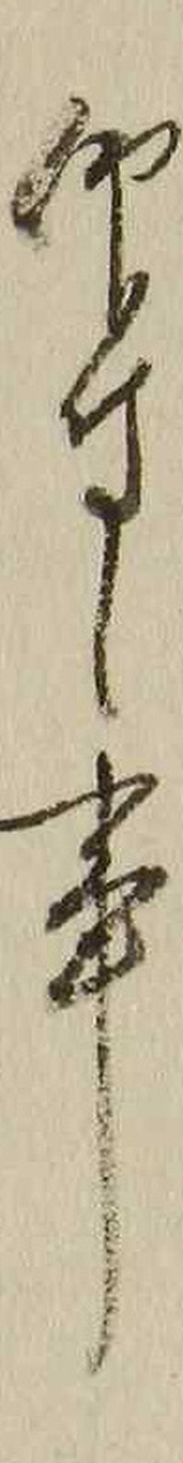仰付候事
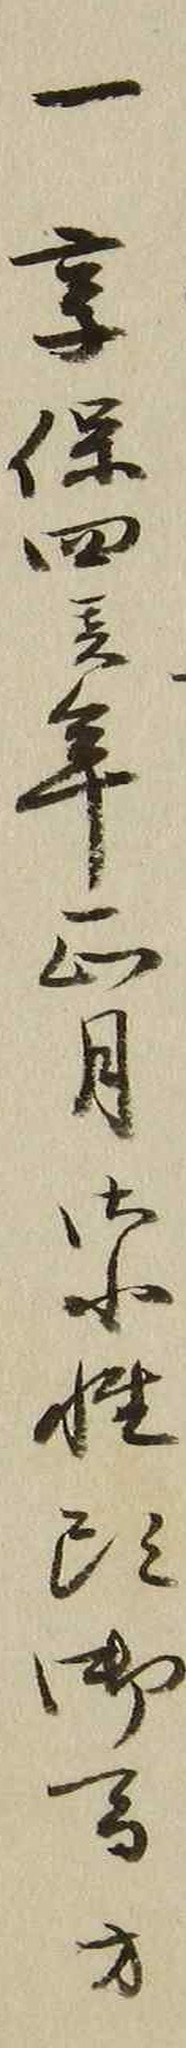一享保四亥年正月御小姓頭御馬方
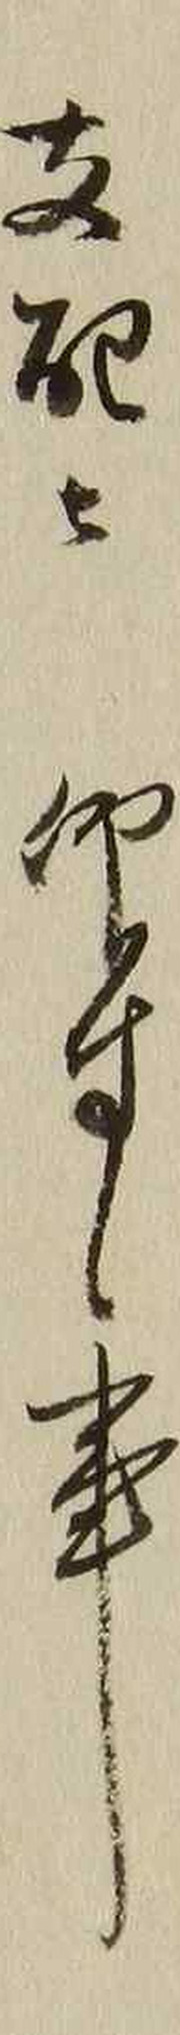支配被仰付候事
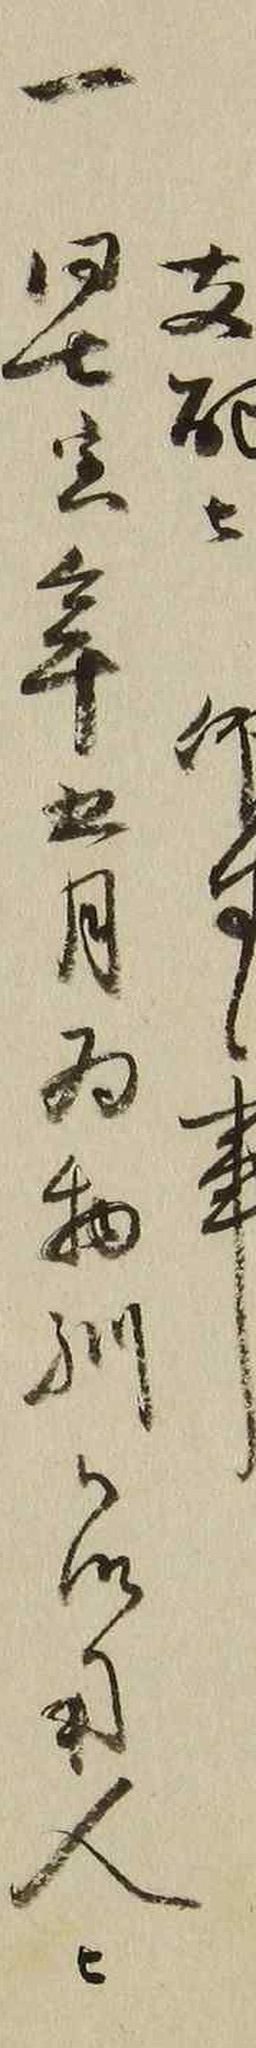一同七寅年五月為物馴候御用人被
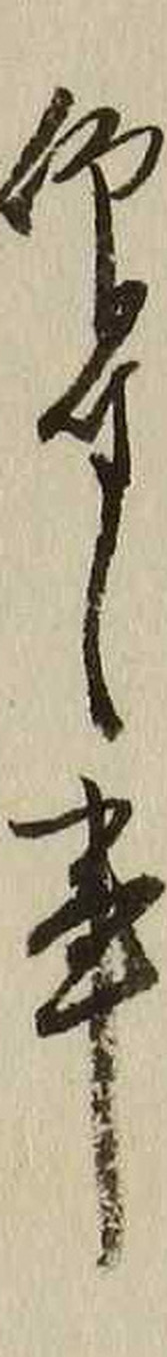仰付候事
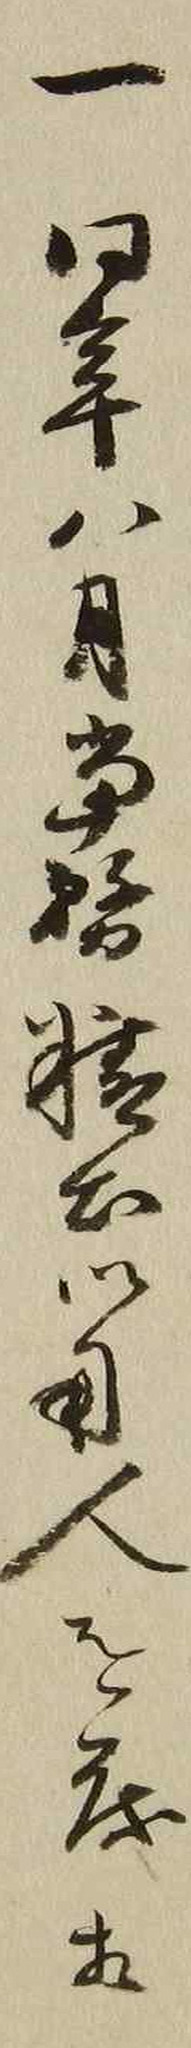一同年八月当務精出御用人をも相
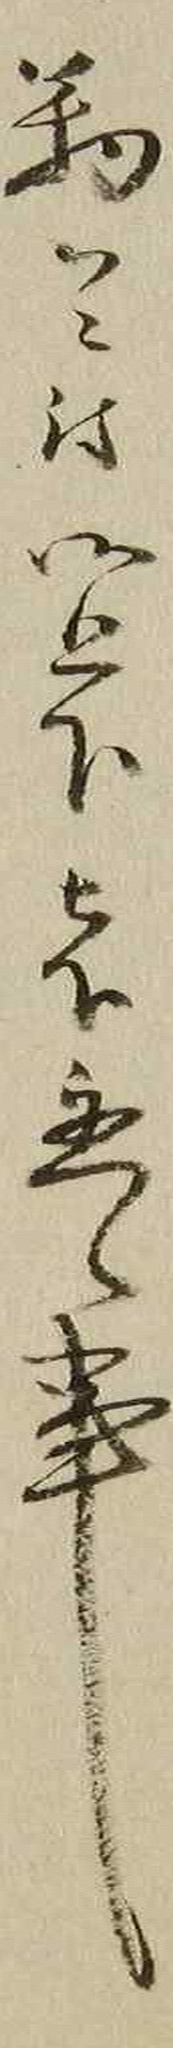勤候に付御上下被下置候事
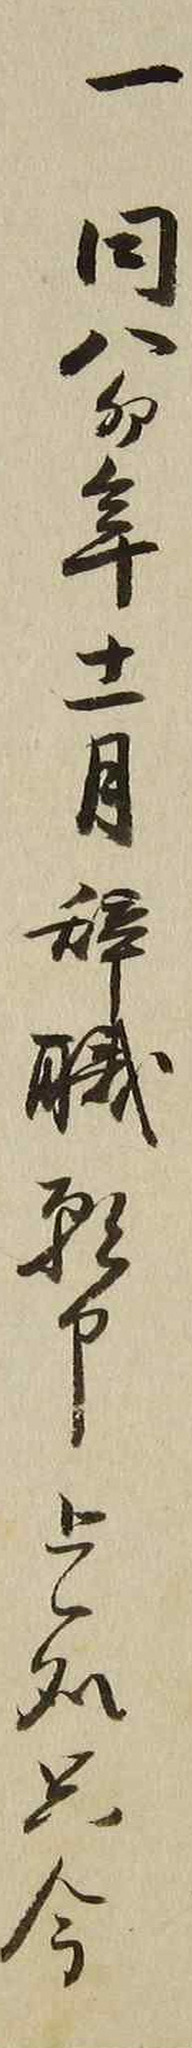一同八卯年十一月辞職願申上候処只今
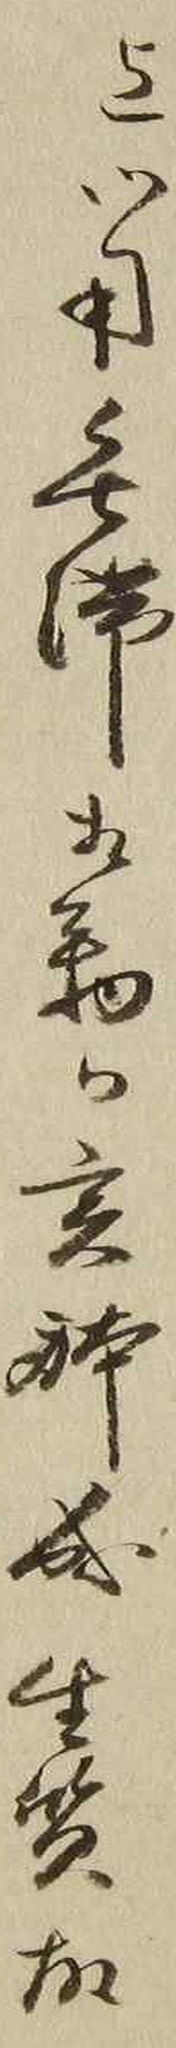迄御用無滞相勤候実体成生質故
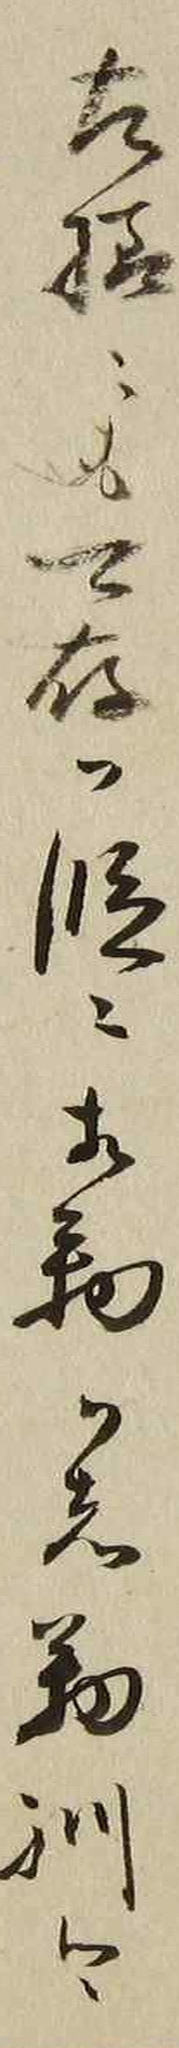左様にも可存候段に相勤候者物馴候に
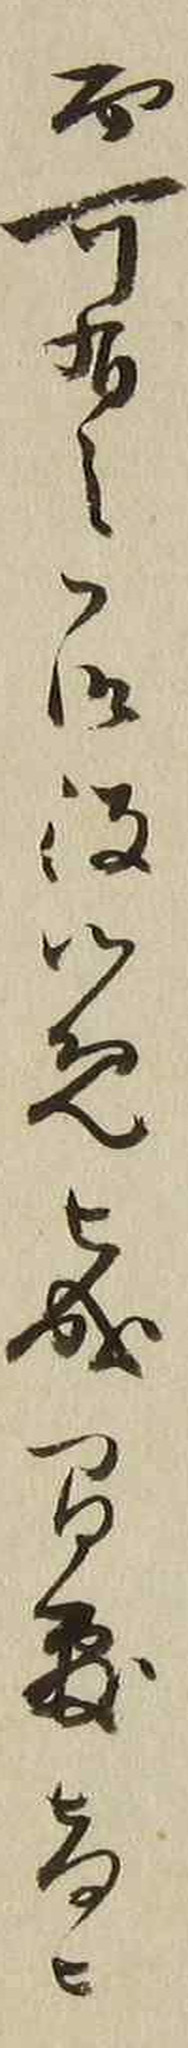不可有之候御役御免被成間敷旨被
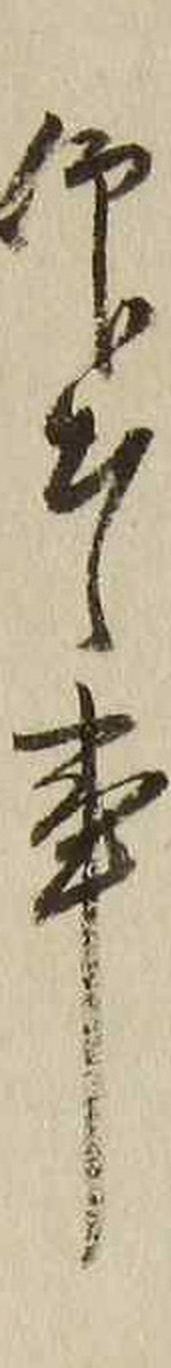仰出候事
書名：諸士系譜　巻之269　さ之部1
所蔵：会津若松市立会津図書館
